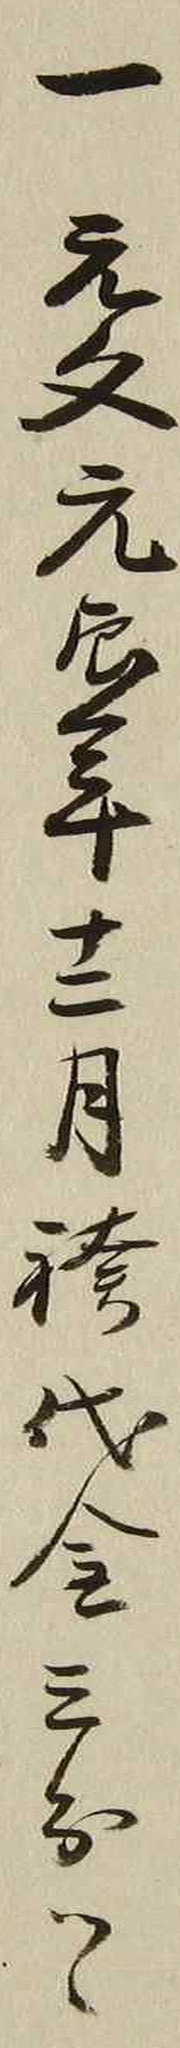一元文元辰年十二月袴代金三分ツヽ
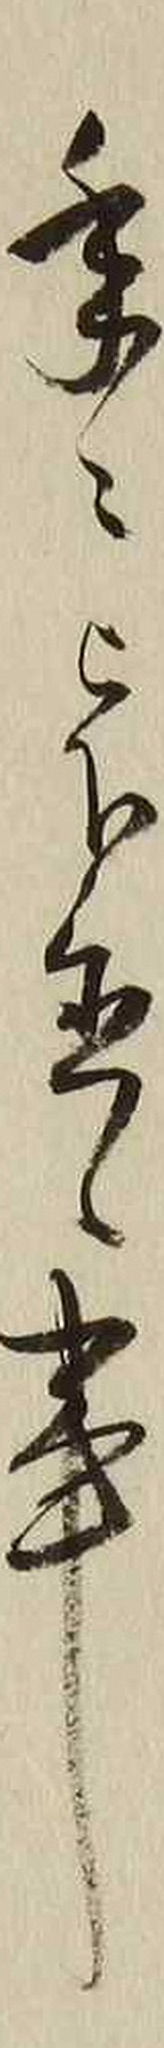年々被下置候事
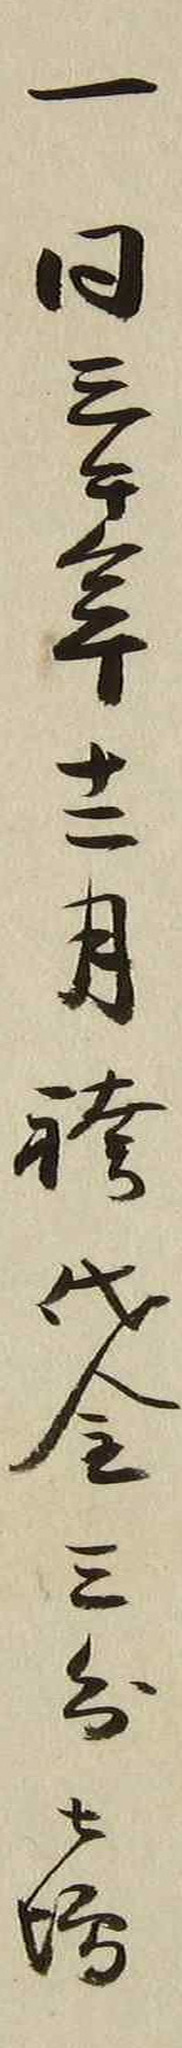一同三午年十二月袴代金三分被増
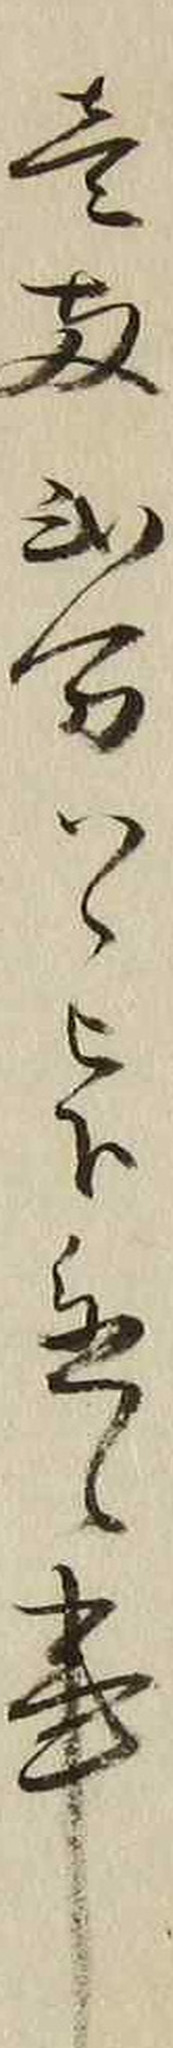壱両弐分つゝ被下置候事
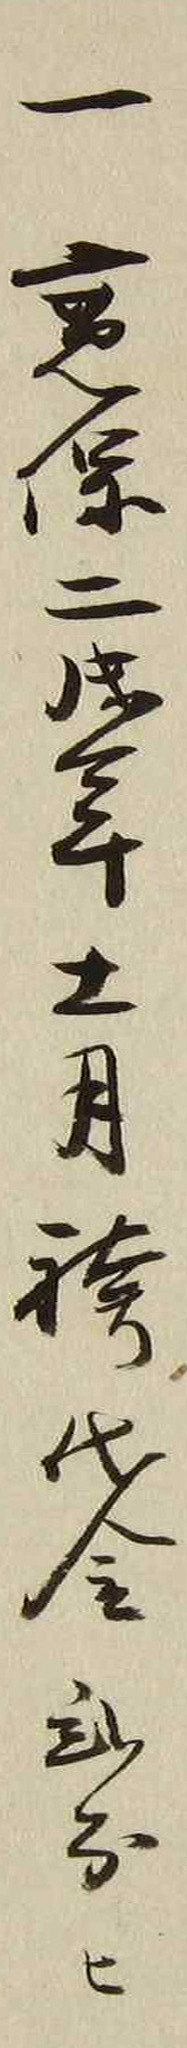一寛保二戌年十一月袴代金弐分被
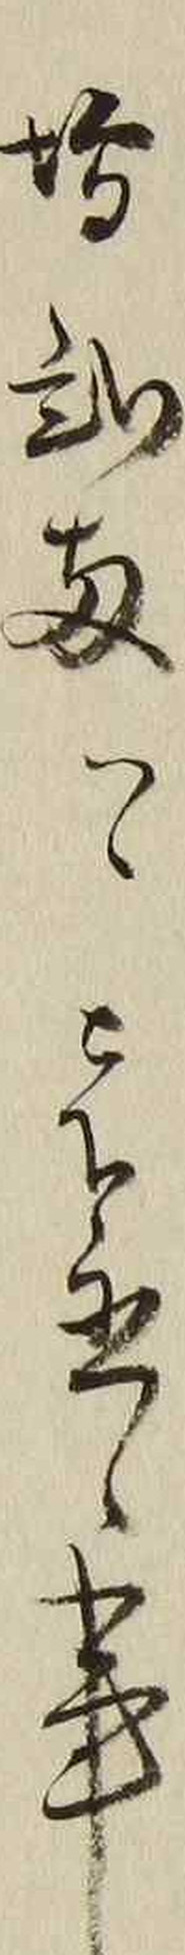増弐両つゝ被下置候事
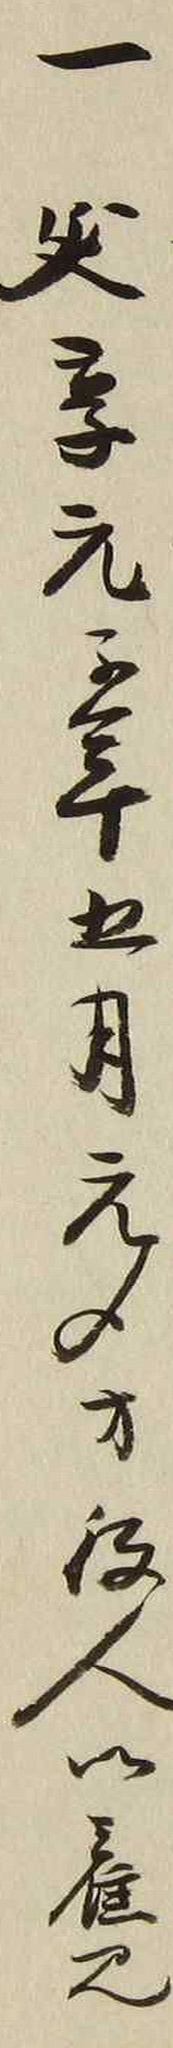一延享元子年五月元〆方役人御雇見
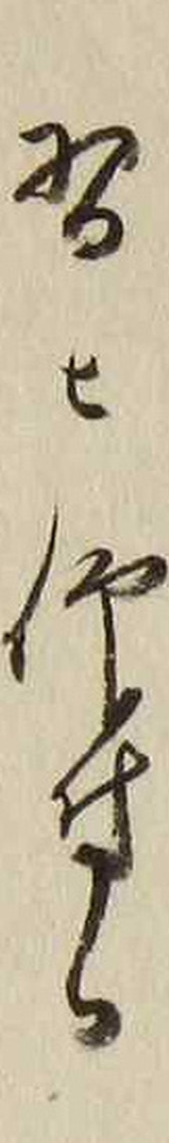習被仰付候
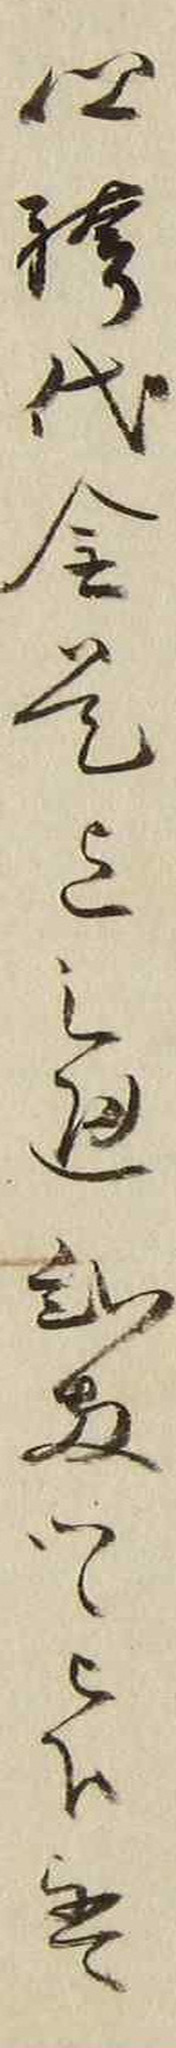但袴代金是迄之通弐両つゝ被下置候

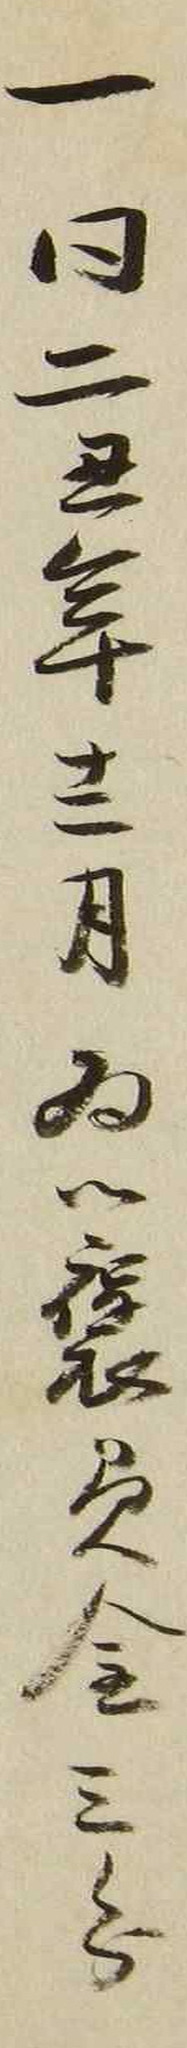一同二丑年十二月為御褒美金三分
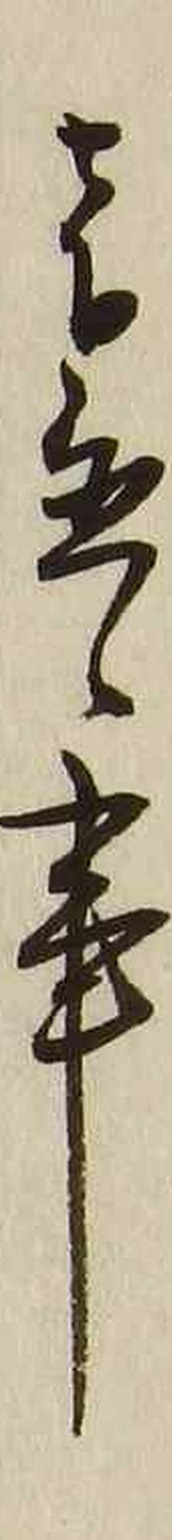被下置候事
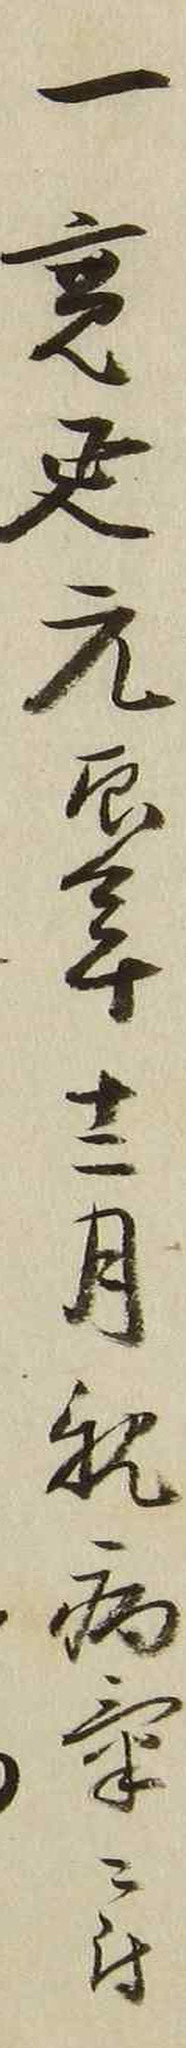一寛延元辰年十二月親病気ニ付
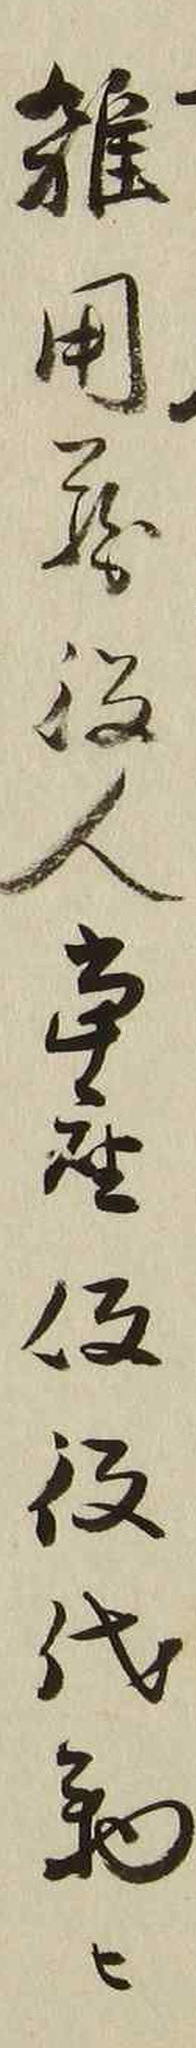雑用蔵役人当座仮役代勤被
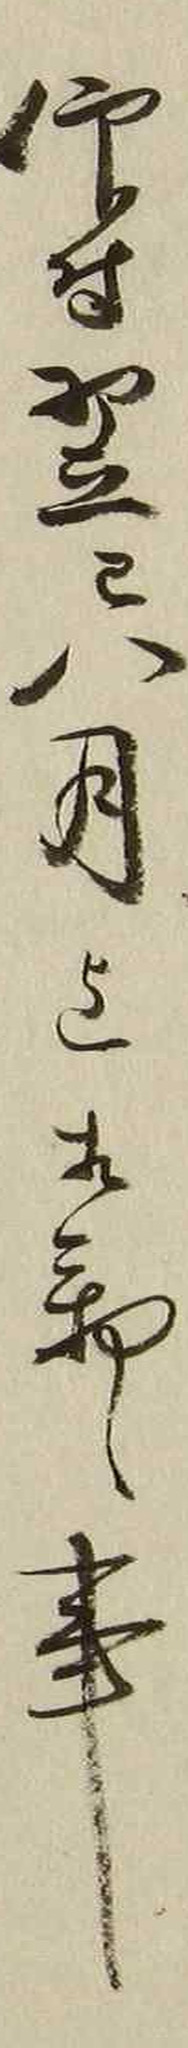仰付翌巳八月迄相勤候事
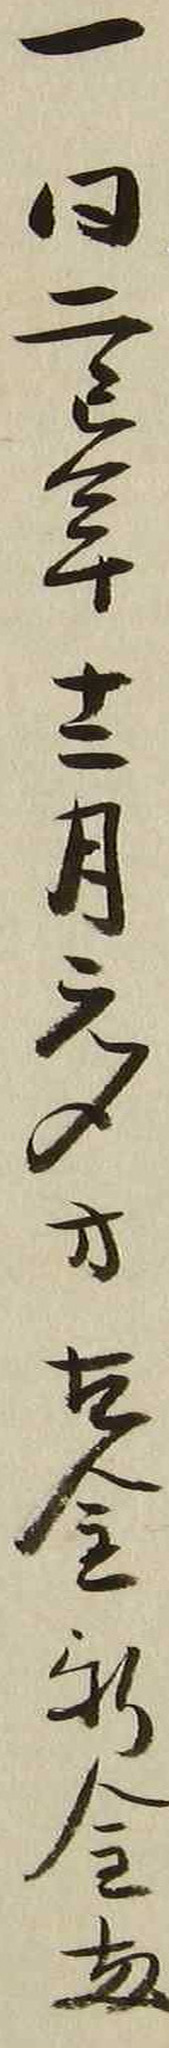一同二巳年十二月元〆方古金新金両
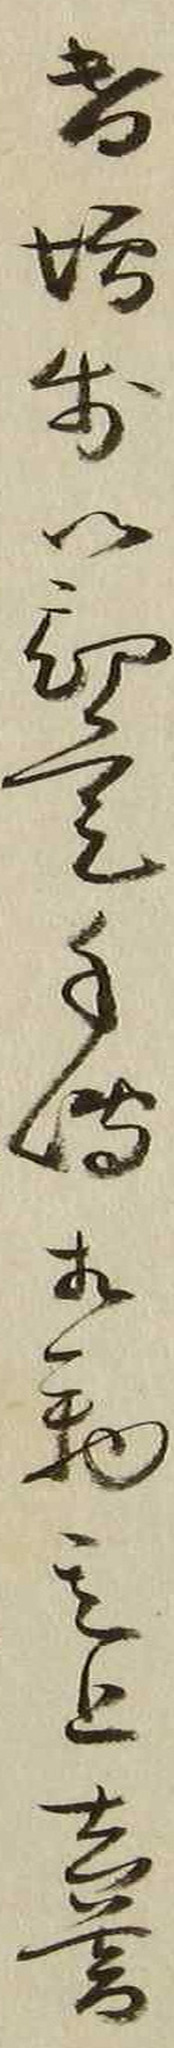替増歩御勘定手伝相勤其上去暮
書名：諸士系譜　巻之288　さ之部20
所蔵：会津若松市立会津図書館
